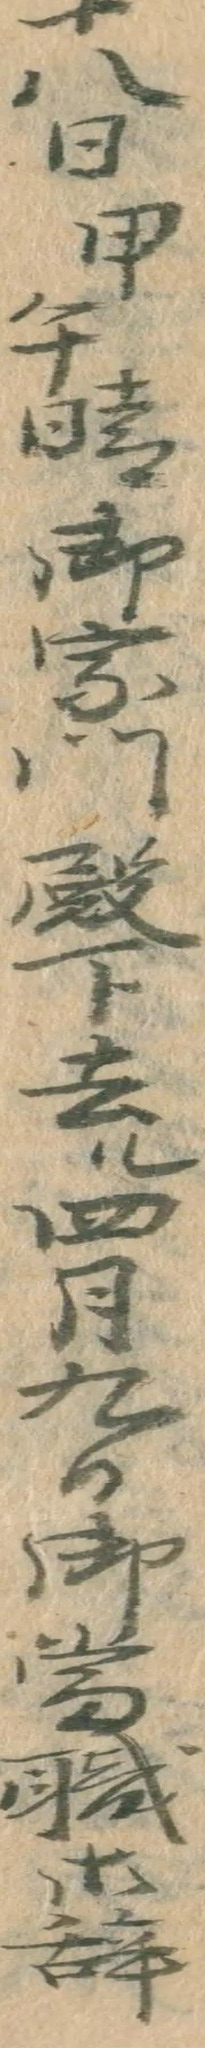十八日甲午晴御家門殿下去ル四月九日御當職御辞
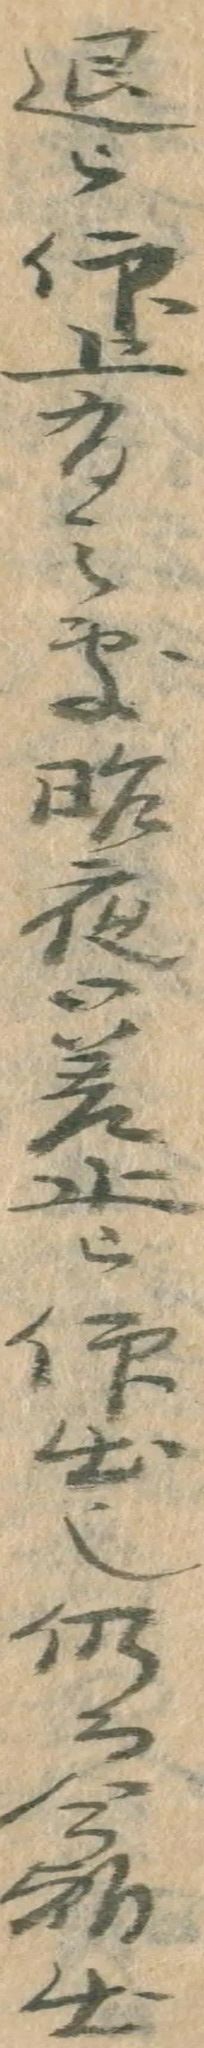退被仰止有之處昨夜御差止被仰出也仍而今朝出
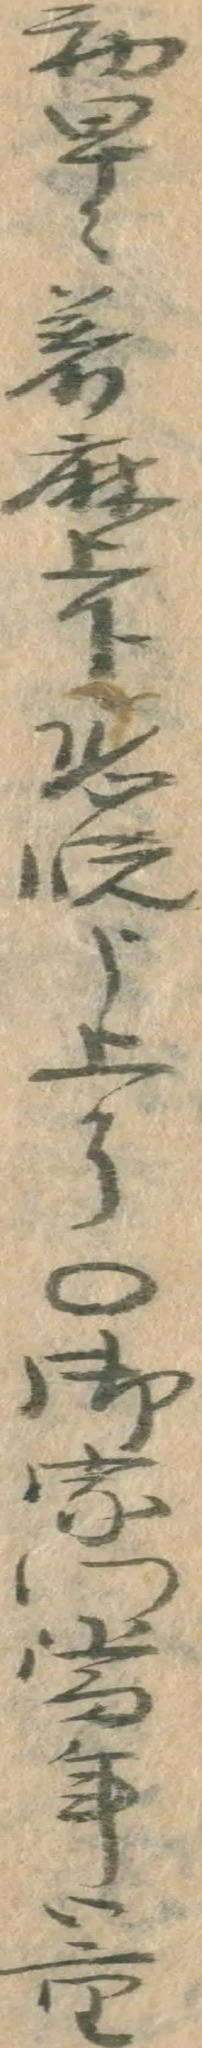勤早々着麻上下恐悦申上了〇御家門當年御重
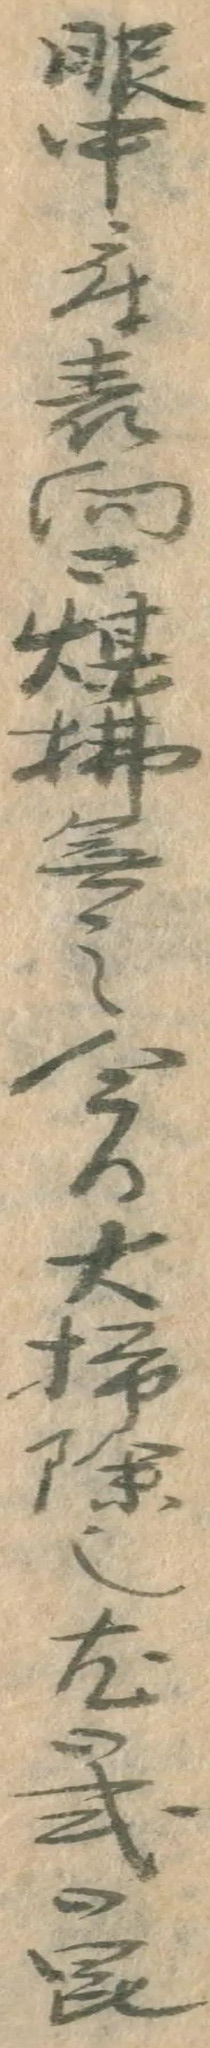服中ニ付表向御煤払無之今日大掃除也尤御式御昆

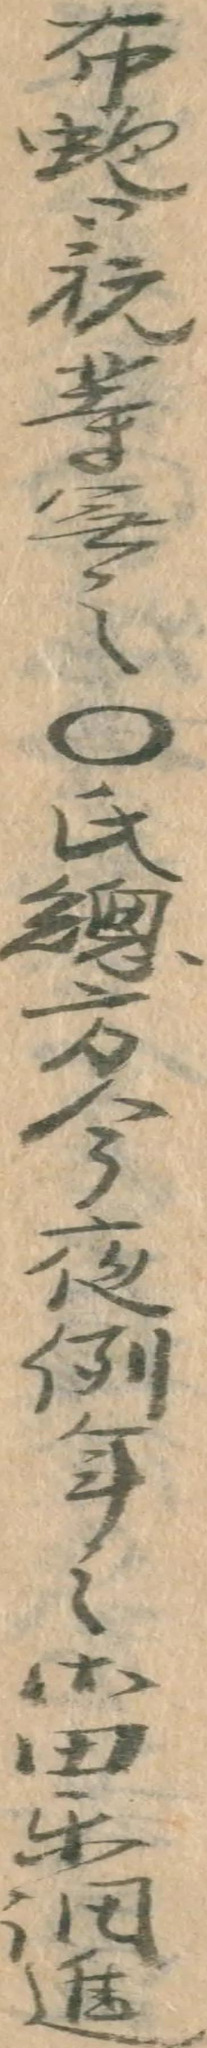布鮑御祝等無之〇氏總方今夜例年之御田楽調進
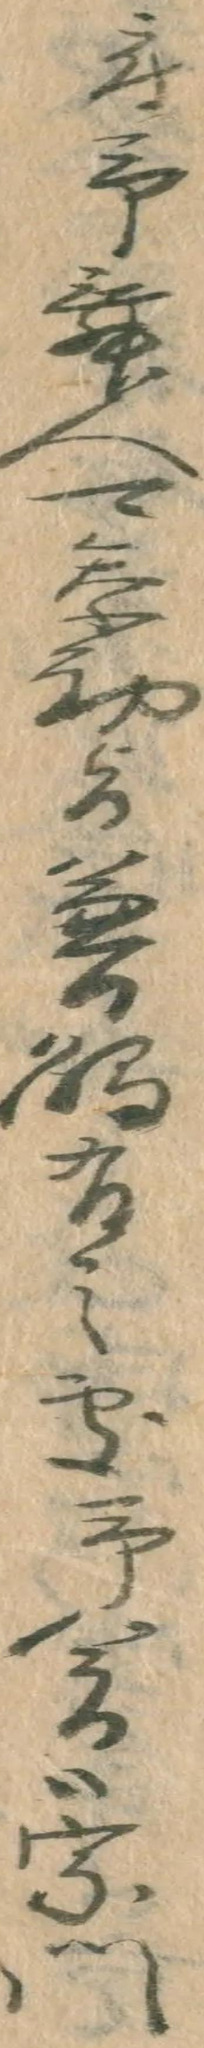ニ付予舞人可参勤旨兼日触有之處予今日御家門
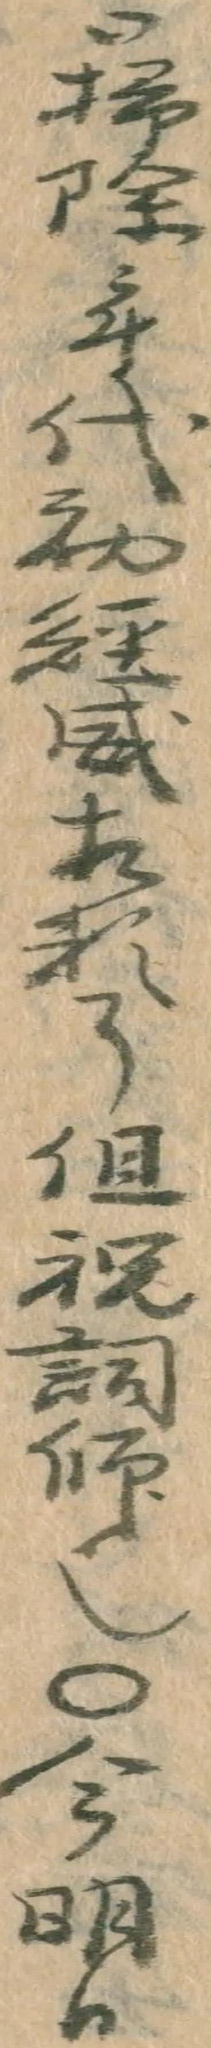御掃除ニ付代勤経威相頼了但祝詞師也○今明日
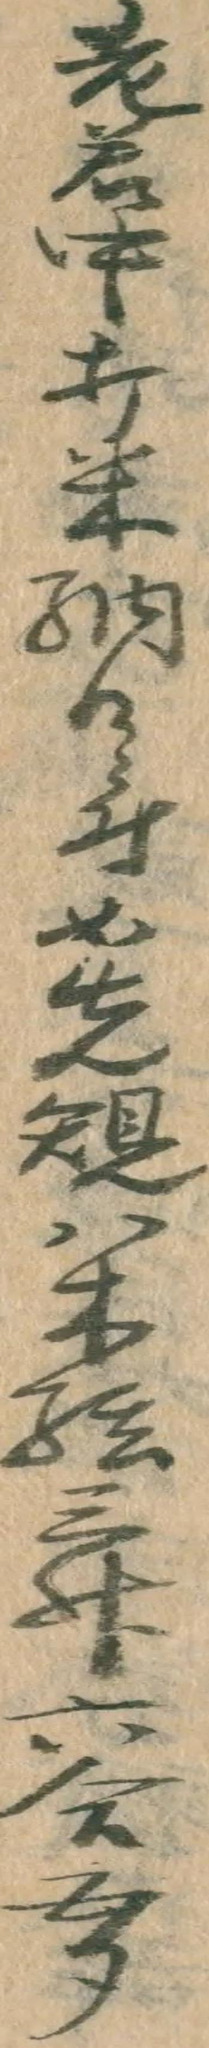老若中打米納候ニ付如先規米結三升六合五勺
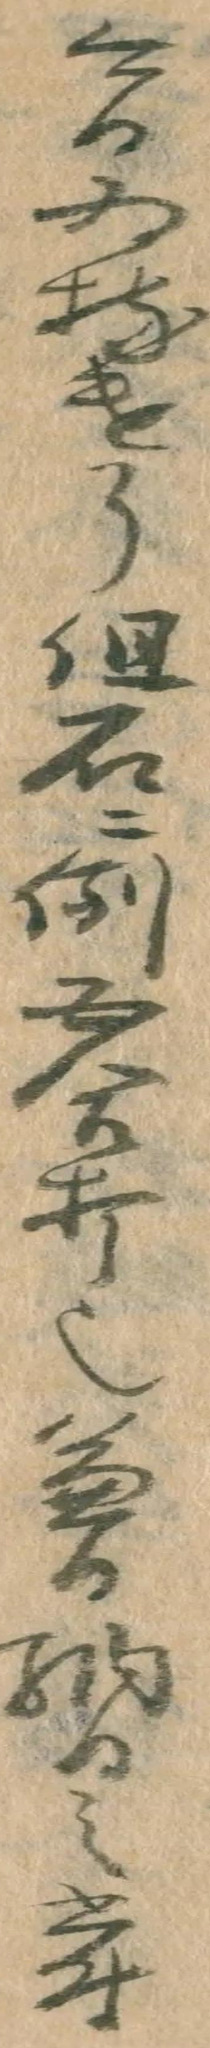今日為持遣了但石ニ例五合打也兼而納日之書付
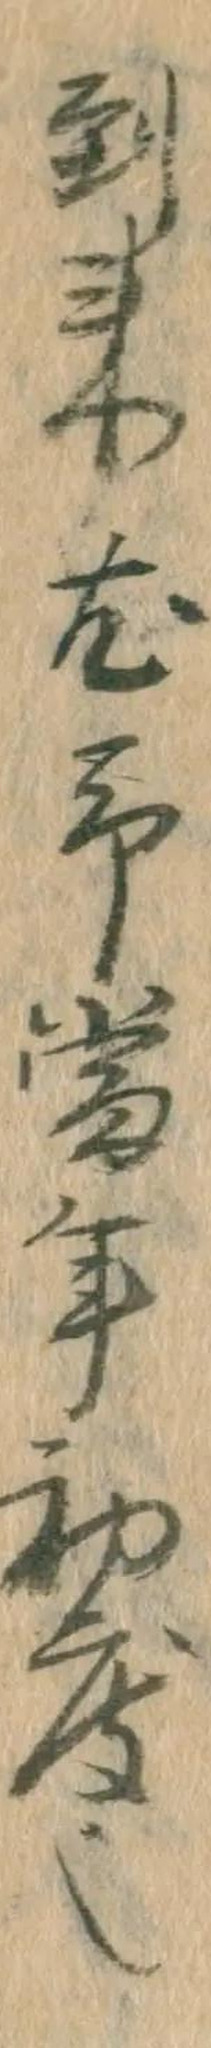到来尤予當年初度也
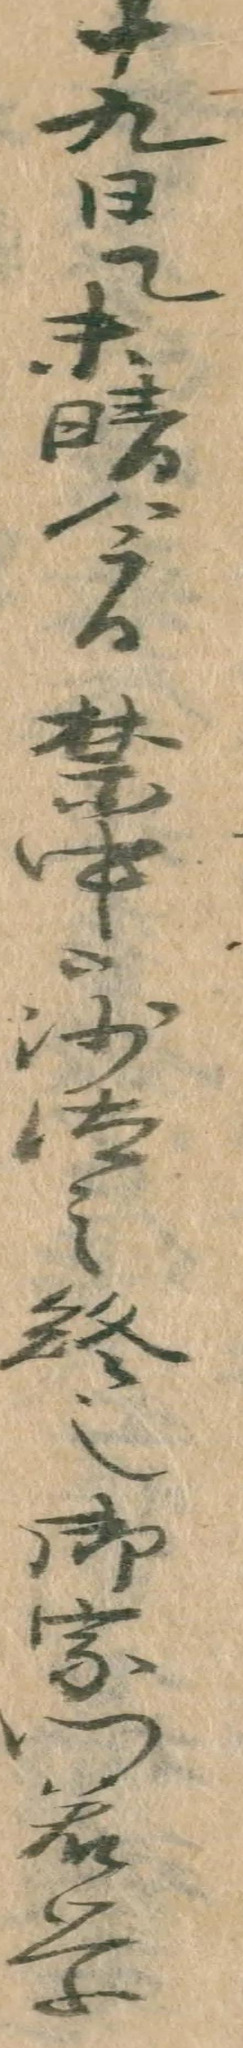十九日乙未晴今日禁中御沙汰之終也御家門若御所
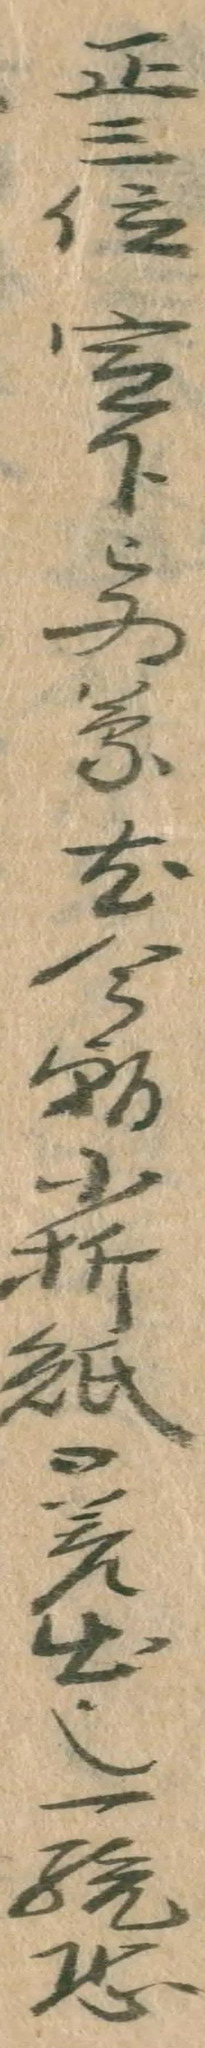正三位宣下被為蒙尤今朝小折紙御差出也一統恐
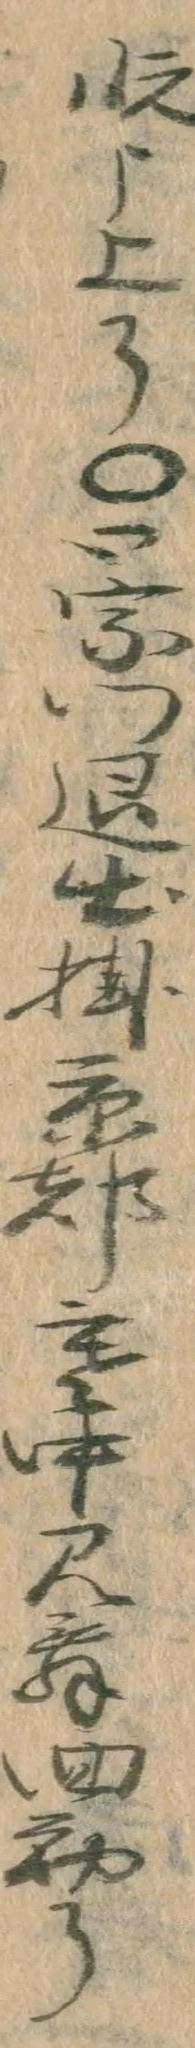悦申上了○御家門退出掛京都寒中見舞回勤了
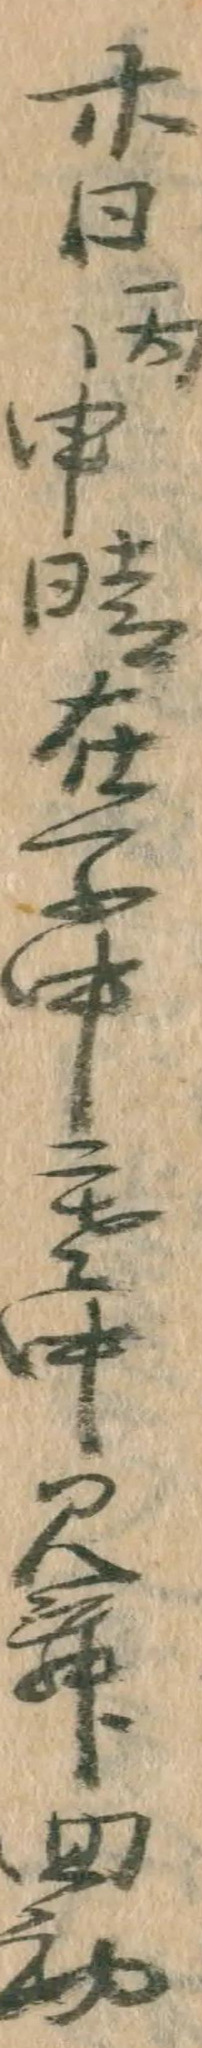廿日丙申晴在所中寒中見舞回動
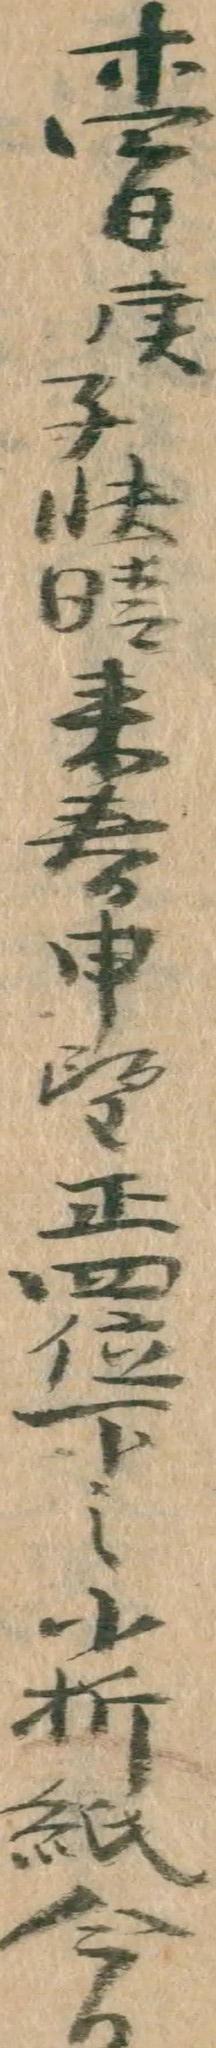廿四日庚子快晴来春申望正四位下之小折紙今日
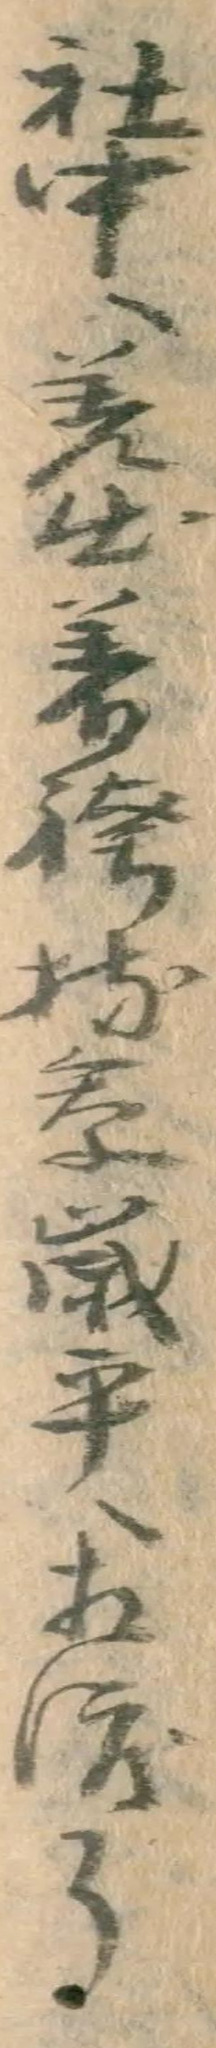社中ヘ差出着袴持参歳平ヘ相渡了
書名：賀茂社記録. 第63冊
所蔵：国立国会図書館 National Diet Library, JAPAN
